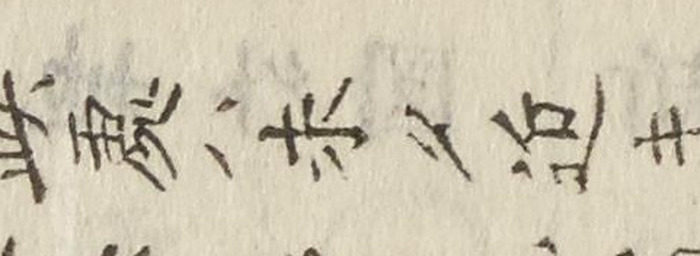此処ハ未タ近キ故
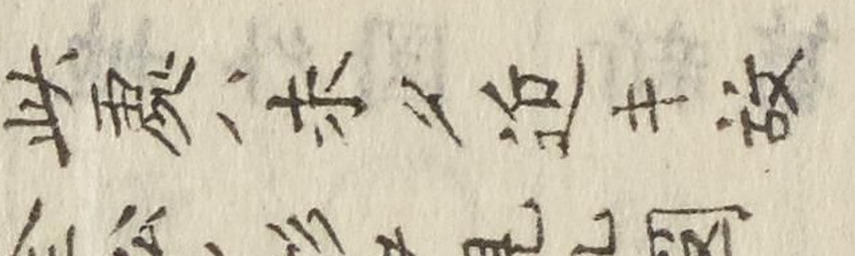此処ハ未タ近キ故
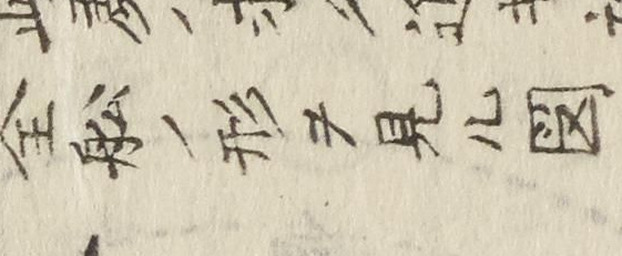全舩ノ形ヲ観ル図
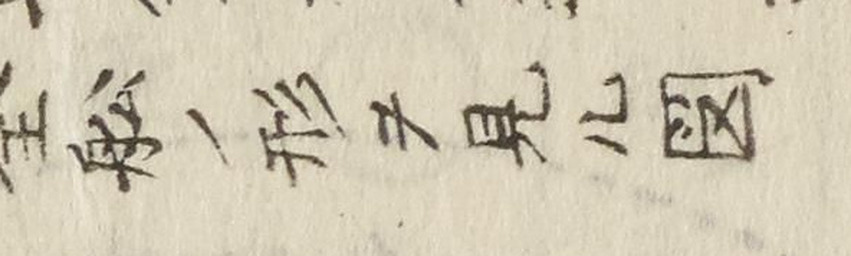全舩ノ形ヲ観ル図
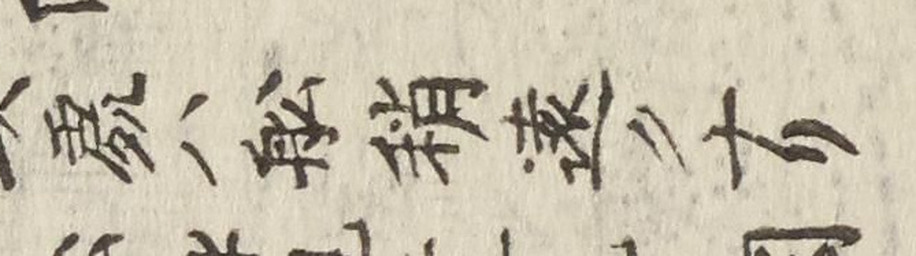此処ハ舩稍遠クナリ
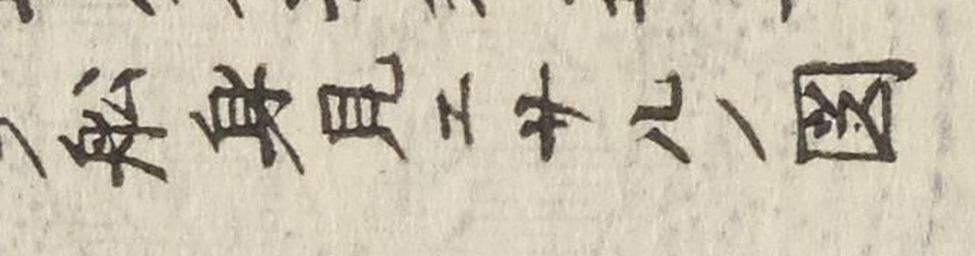テ舩身見エサルノ図
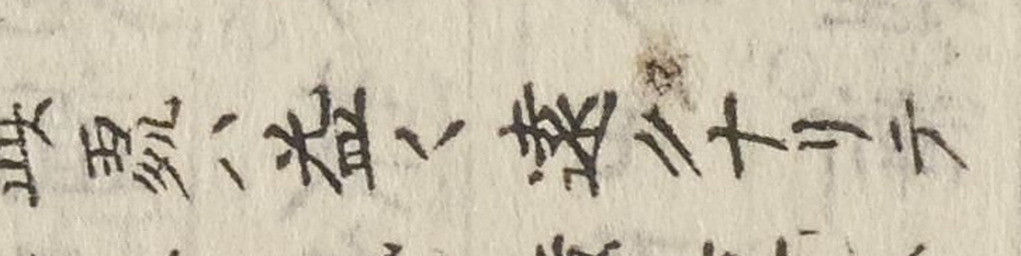此処ハ益〳〵遠クナリテ
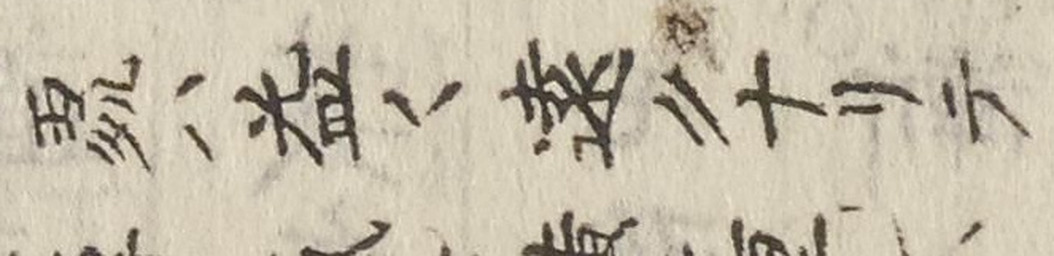此処ハ益〳〵遠クナリテ
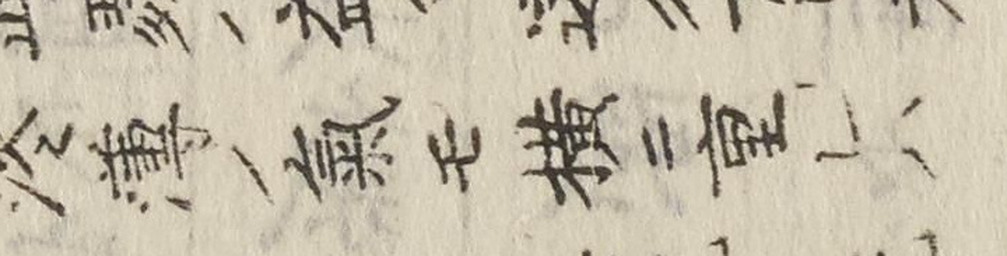淡薄ノ気モ横ニ重レハ
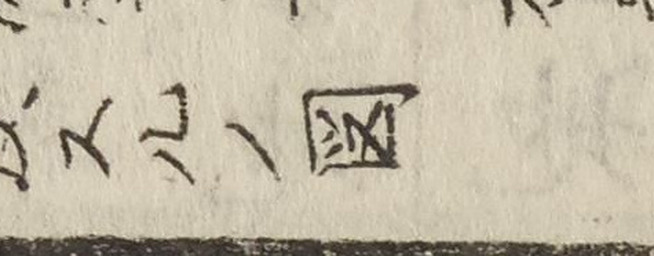没スルノ図
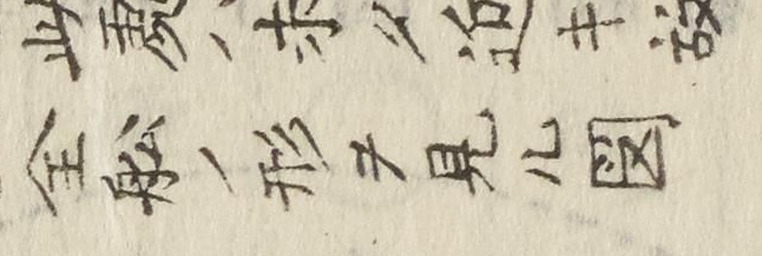全舩ノ形ヲ観ル図
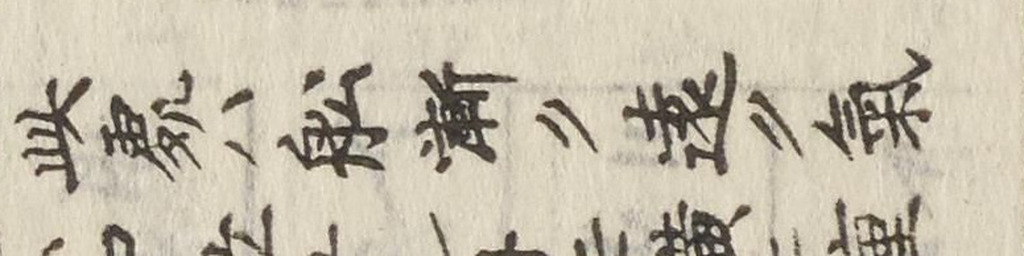此処ハ舩漸ク遠ク気
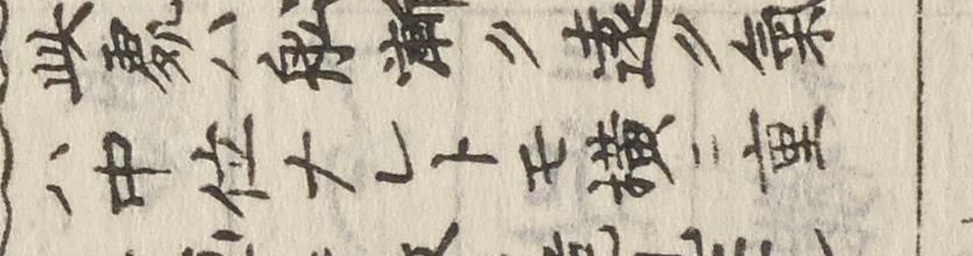ハ中位ナレトモ横ニ重
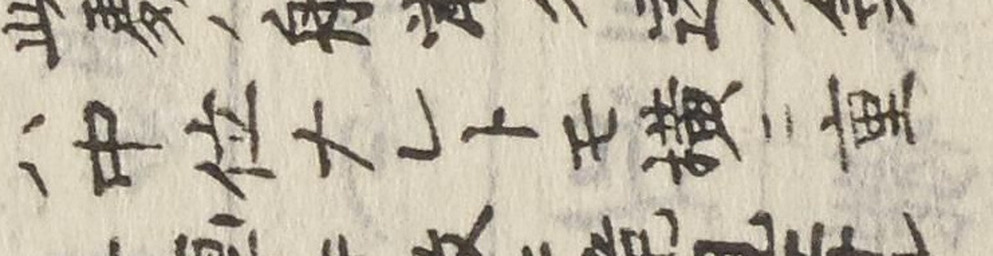ハ中位ナレトモ横ニ重
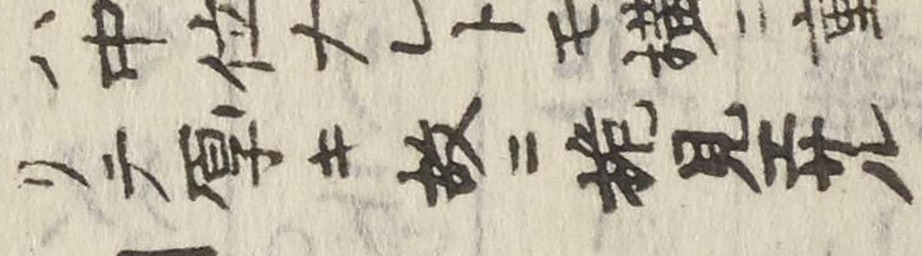リテ厚キ故ニ桅見エサル
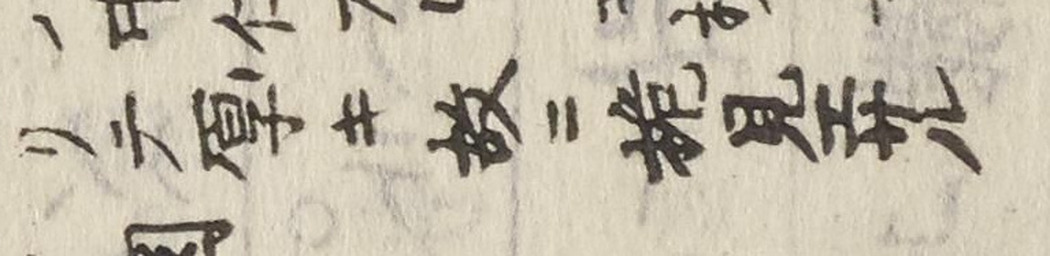リテ厚キ故ニ桅見エサル
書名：護法新論　中
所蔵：東京大学地震研究所図書室 Earthquake Research Institute Library, The University of Tokyo, JAPAN
